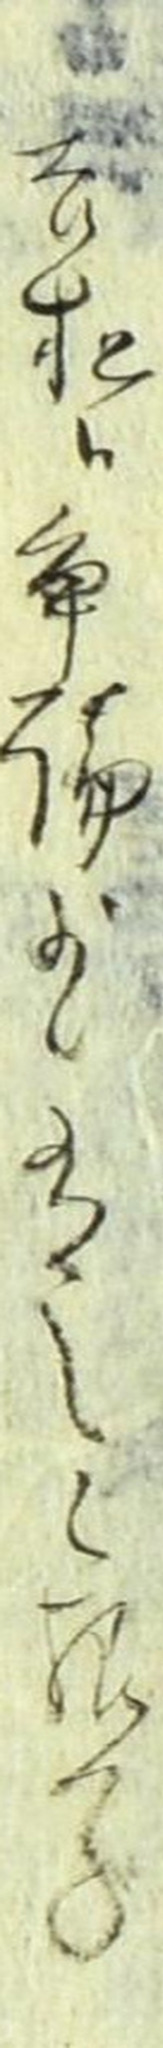吉松江争論少し有之候様子

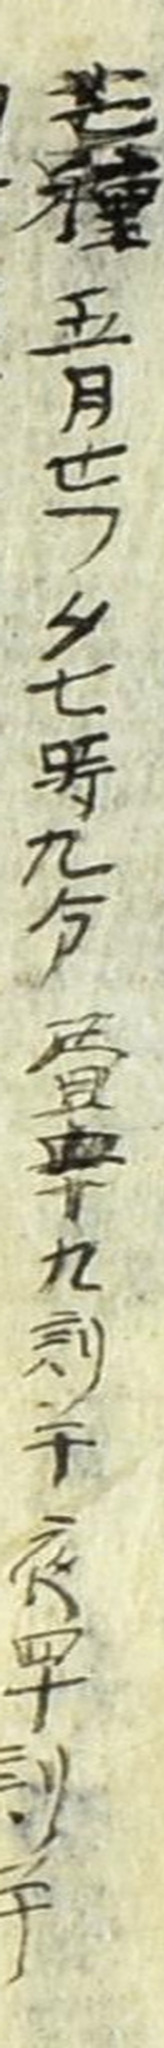芒種五月せつ夕七時九分昼四十九刻半夜四十刻半
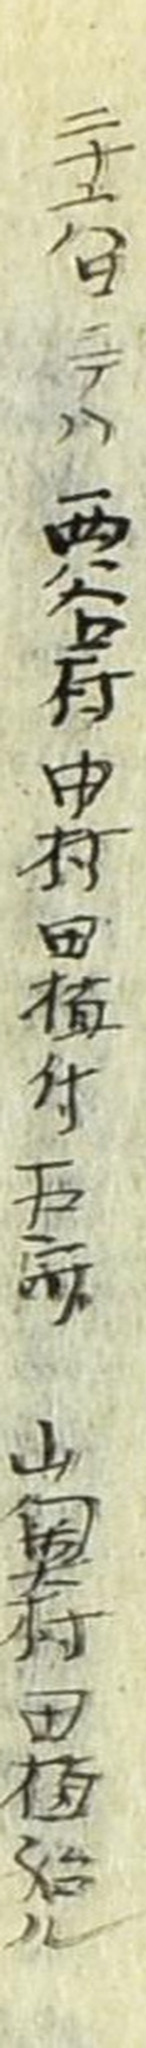二十六日ニテハ西谷村田植付相済山奥村田植始ル
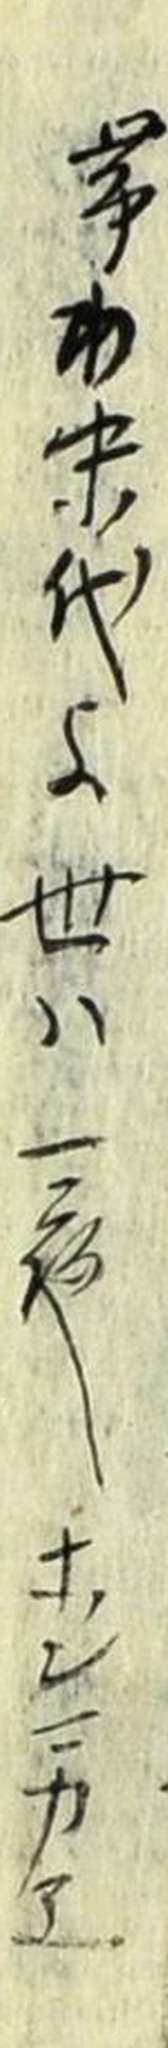帯わ末代よ世ハ一夜ホンマカヱ

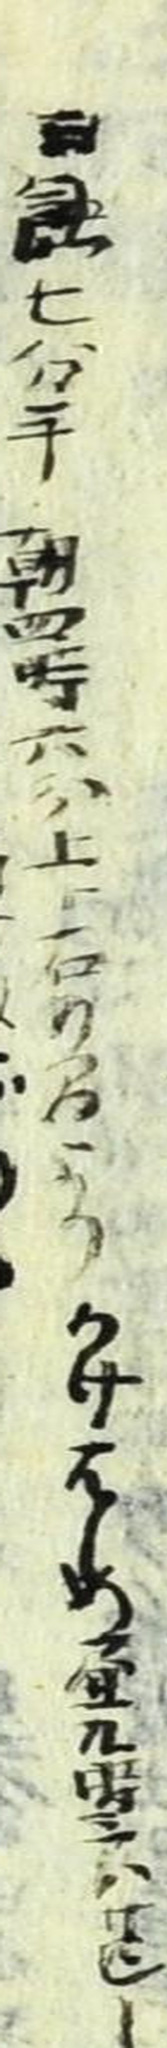日蝕七分半朝四時六分上下石の間よりかけはしめ昼九時三は甚しく
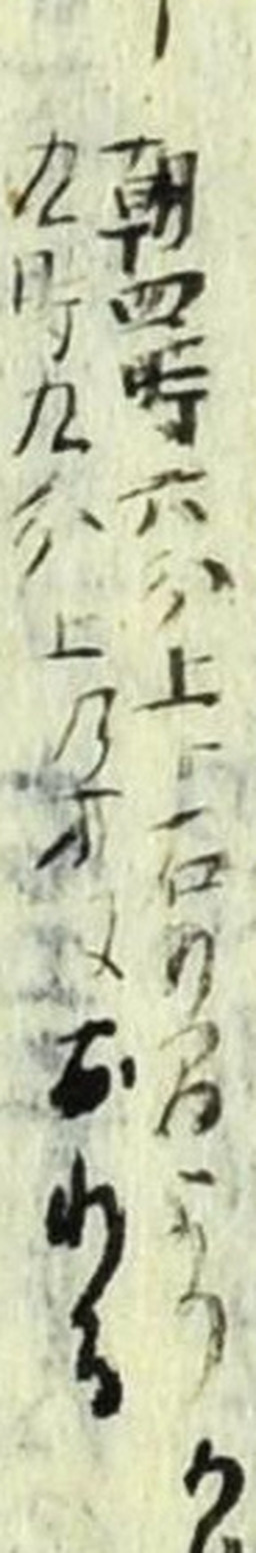九時九分上の方へおわる
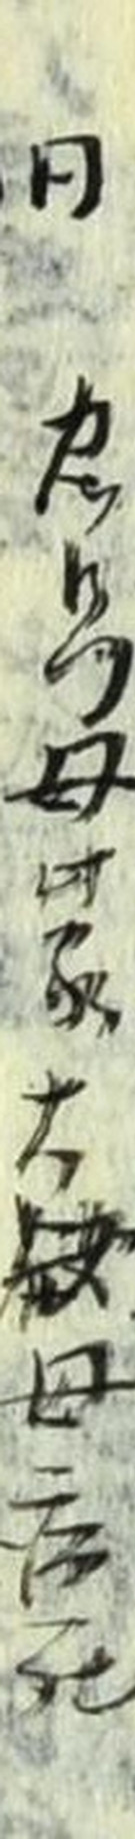同忠左衛門母此家大叔母病死
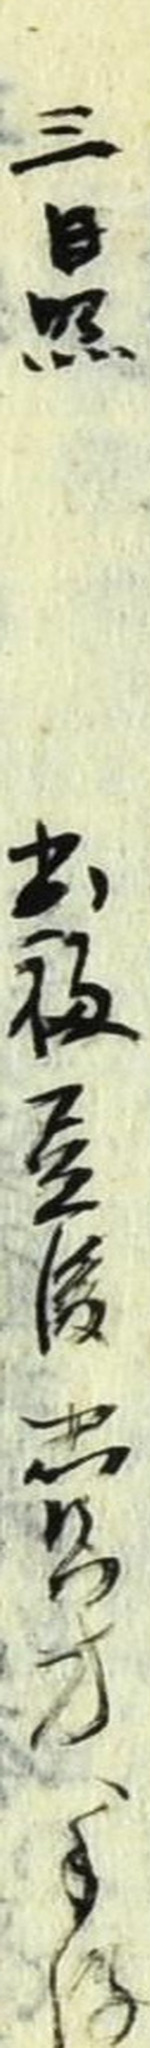三日照出福昼後忠左衛門方へ手伝
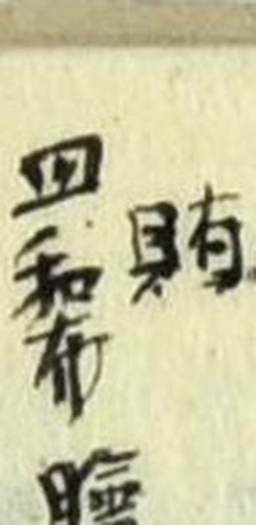汁和布
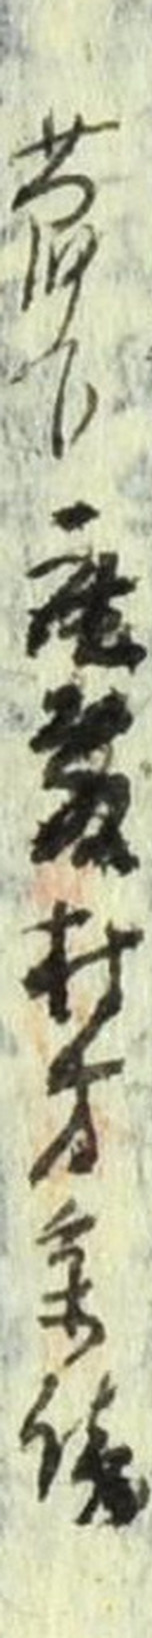旧下座敷村方参餞
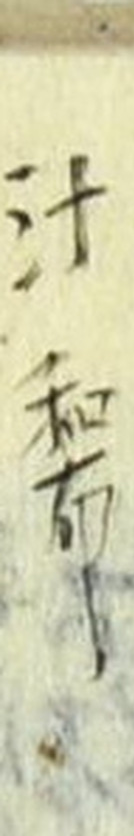汁和布
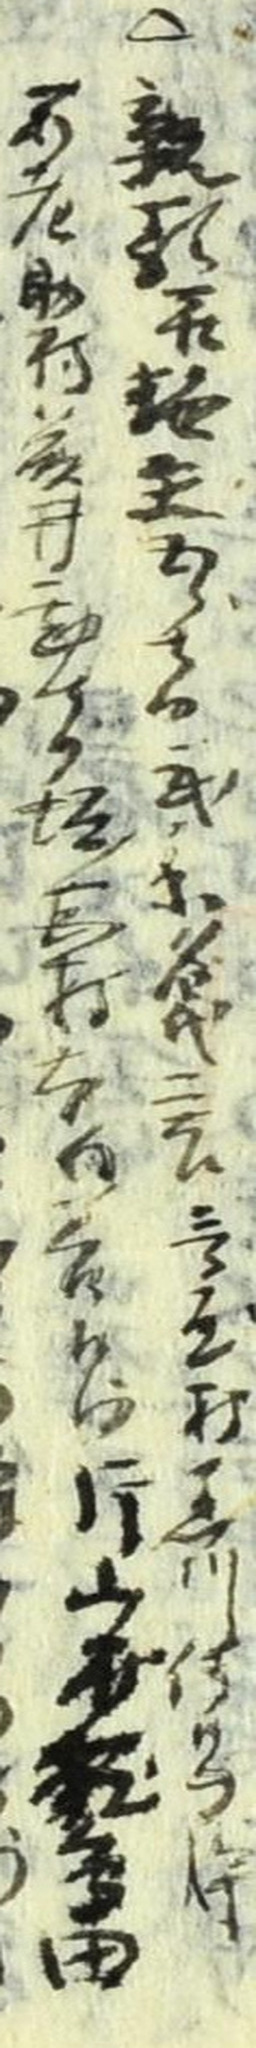不老助村藤井勘右衛門坂ノ長村太田善左衛門片山村島田
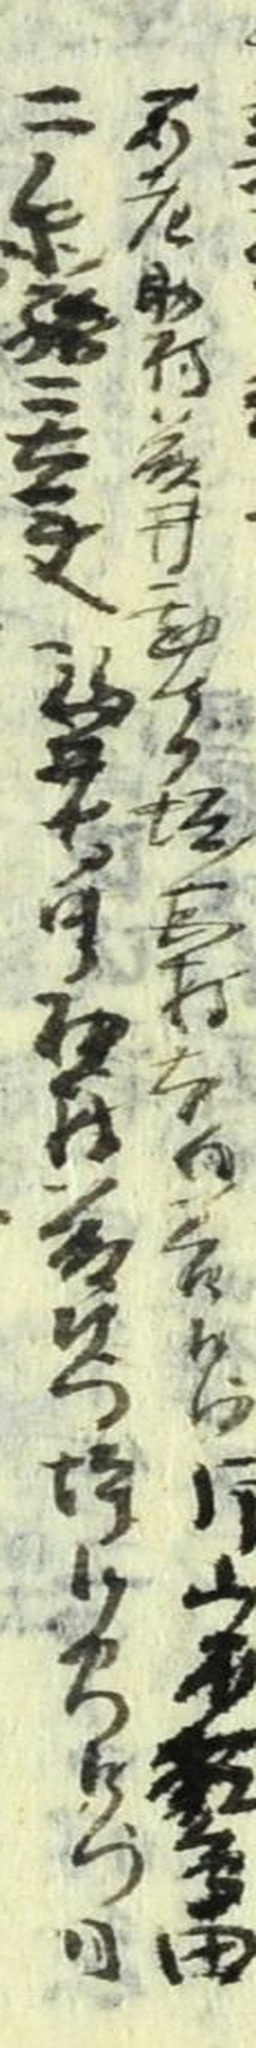二兵衛孫二太夫福井右同福村藤左衛門坪川忠左衛門同
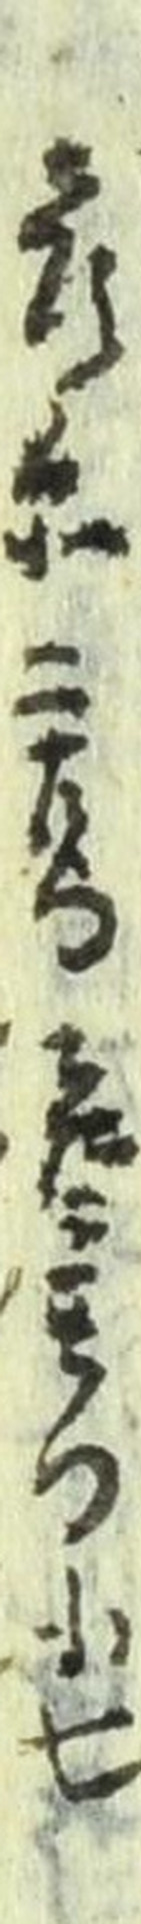彦兵衛二左衛門彦三右衛門小七
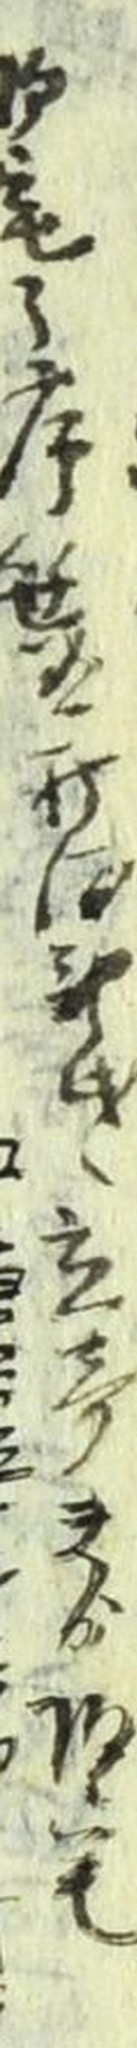帰宅之序笹谷村渡部氏へ立寄夫ゟ帰宅
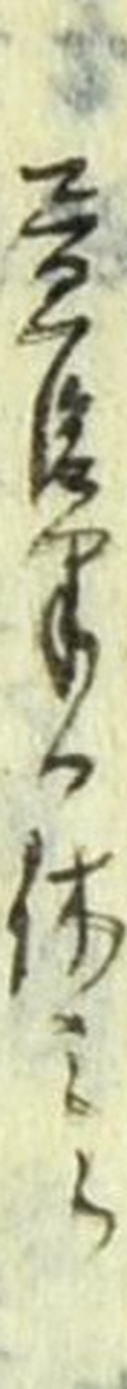昼後半日休ミ候
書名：（日記）
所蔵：福井県文書館 Fukui Prefectural Archives
